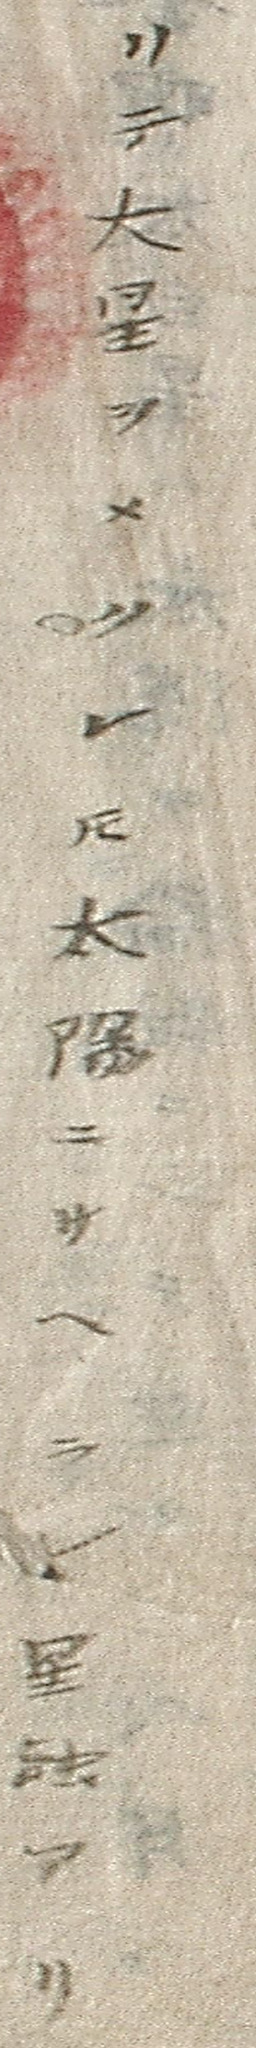リテ大星ヲメクレモ太陽ニサヘラレ星蝕アリ
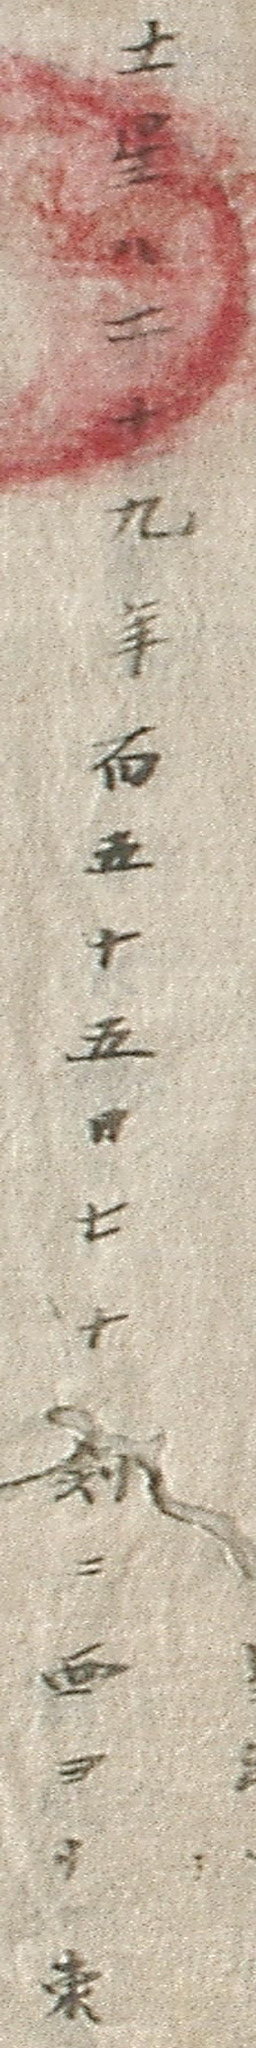土星ハ二十九年百五十五日七十刻ニ西ヨリ東
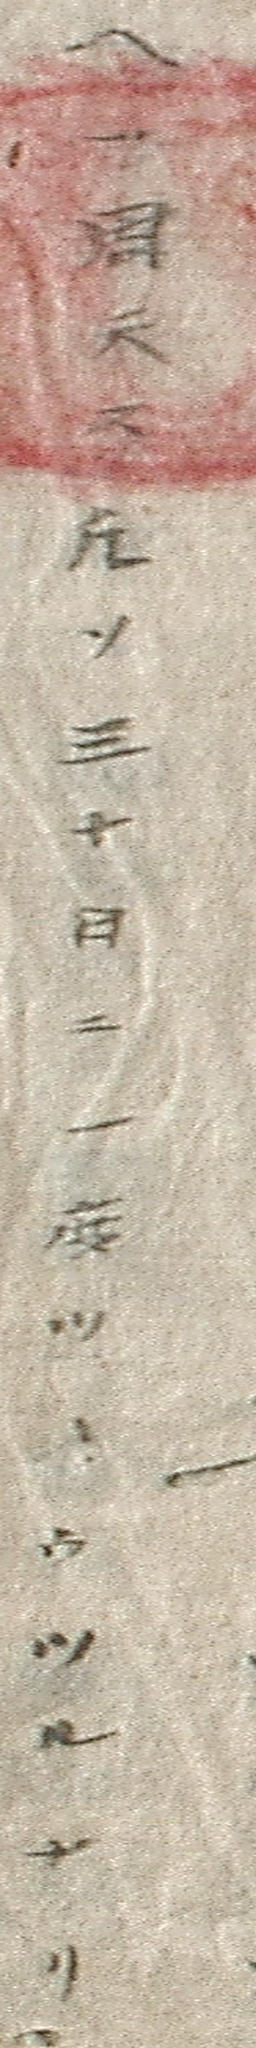ヘ一周天ス凡ソ三十日ニ一度ツヽウツルナリ

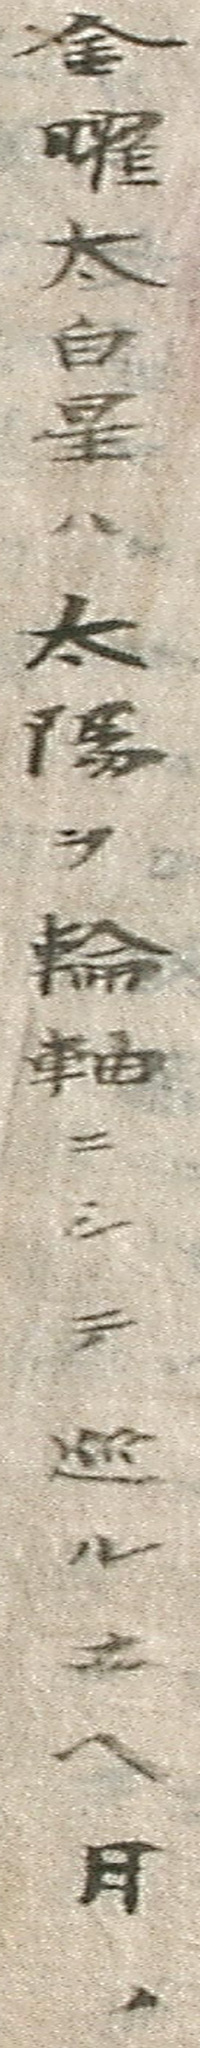金曜太白星ハ太陽ヲ輪軸ニシテ巡ルユヘ月ノ
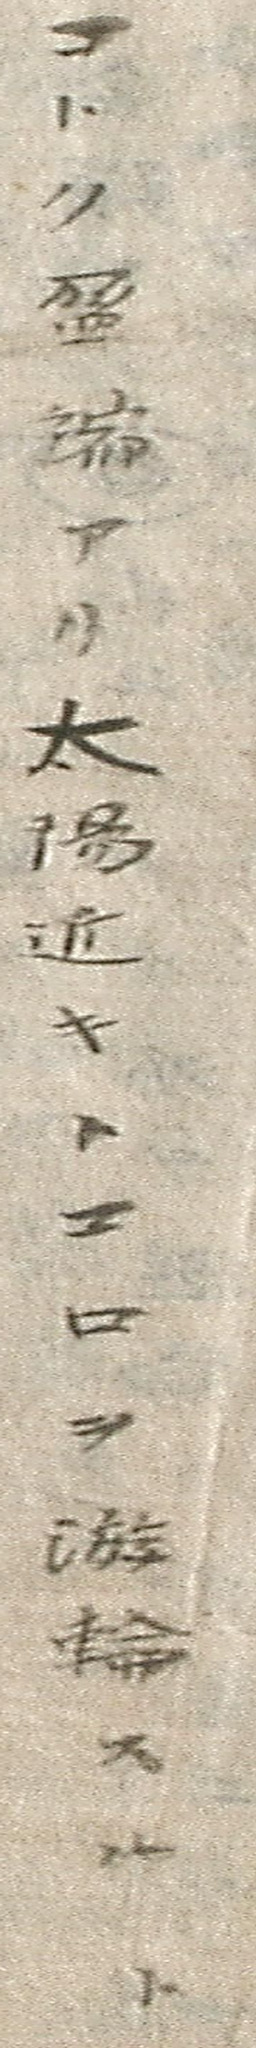コトク暦縮アリ太陽近キトコロヲ游輪スルト
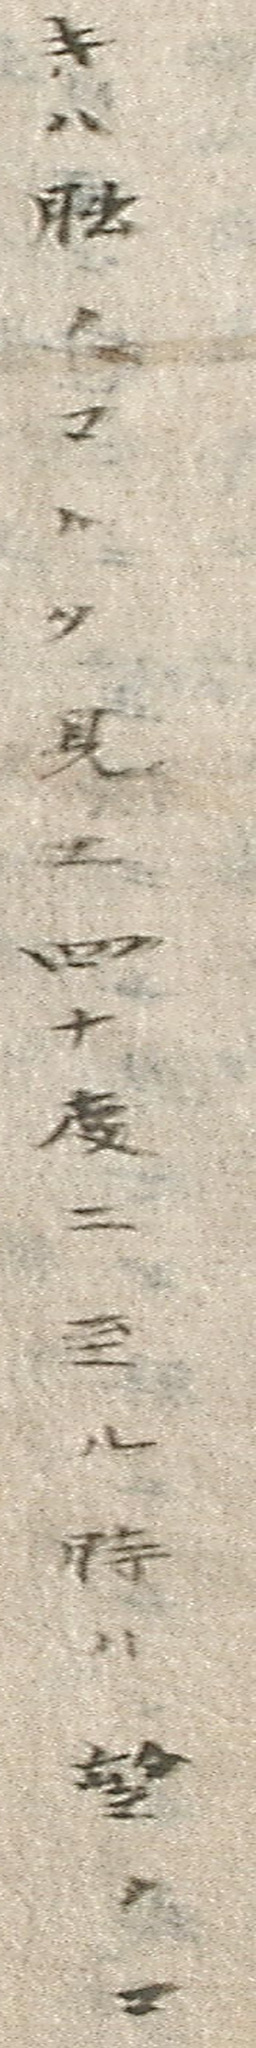キハ胱ノコトク見ユ四十度ニ至ル時ハ望ノコ
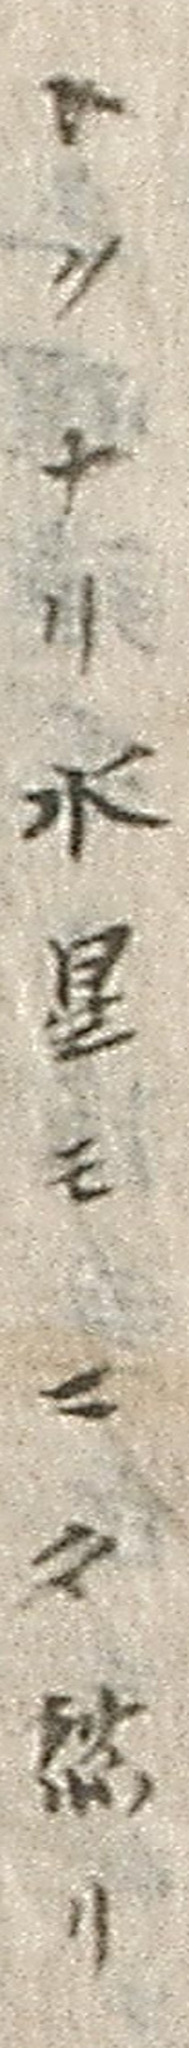トクナリ水星モニタ然リ
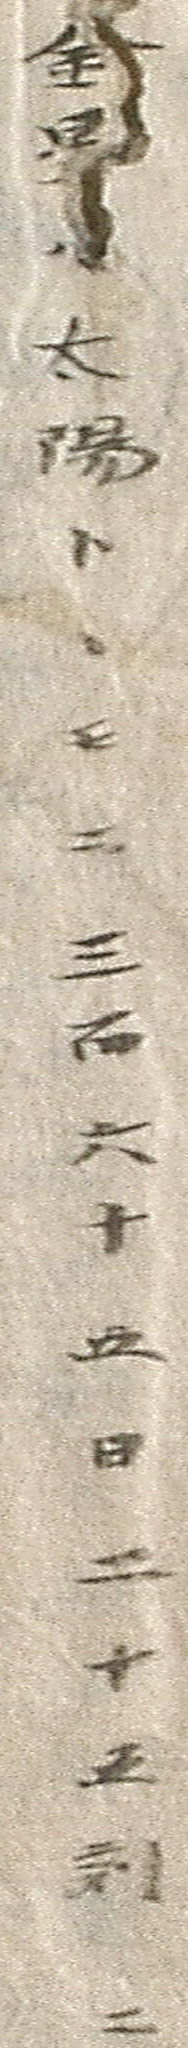金星ハ太陽トヽモニ三百六十五日二十五刻ニ
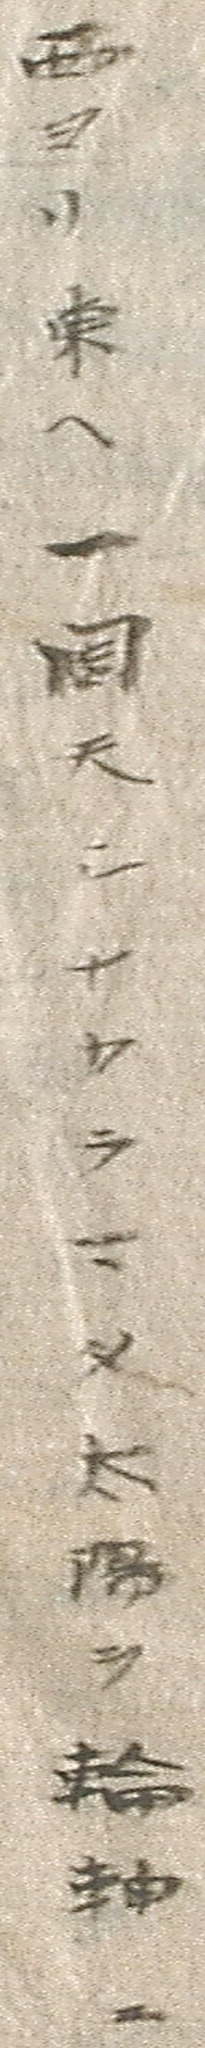西ヨリ東ヘ一周天シナカラマタ太陽ヲ輪軸ニ
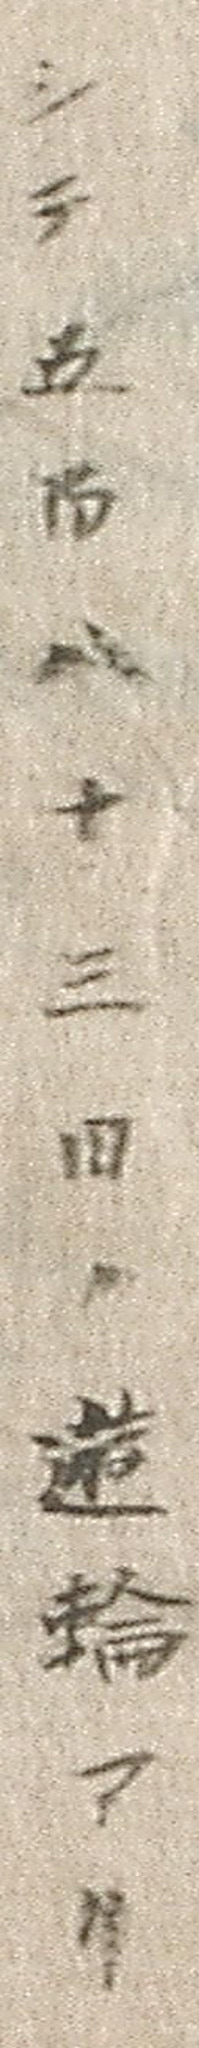シテ五百八十三日ノ遊輪アリ
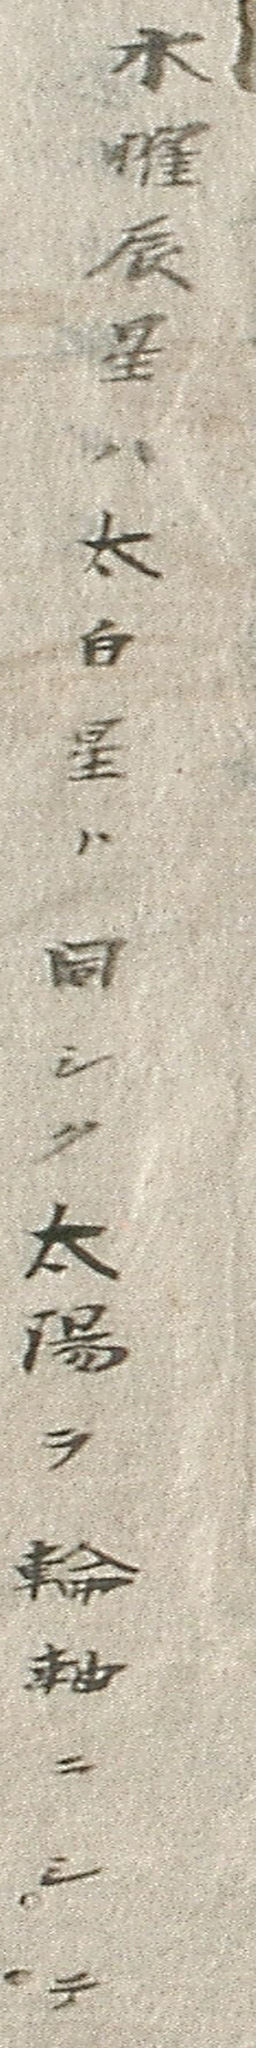木曜辰星ハ太白星ト同シク太陽ヲ輪軸ニシテ
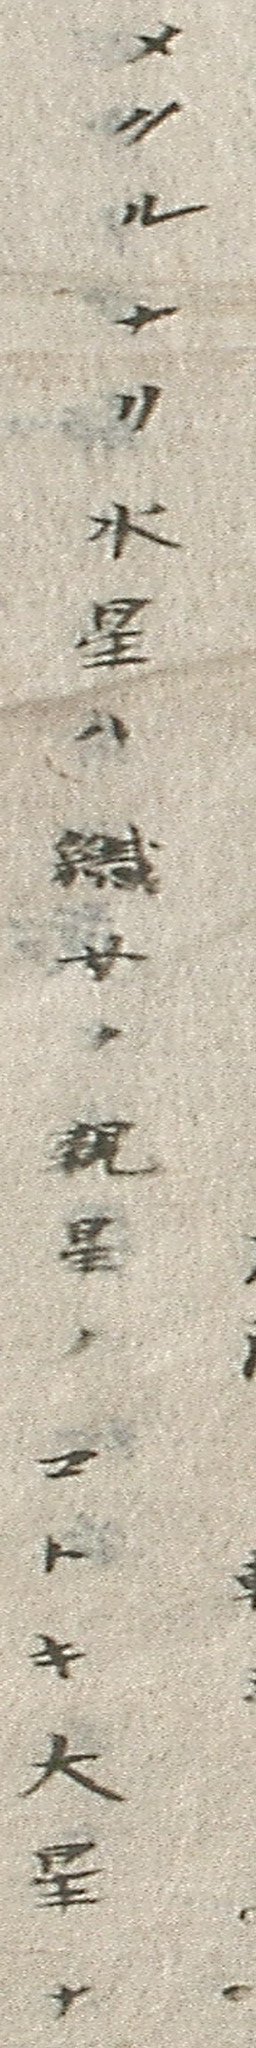メクルナリ木星ハ織女ノ親星ノコトキ大星ナ
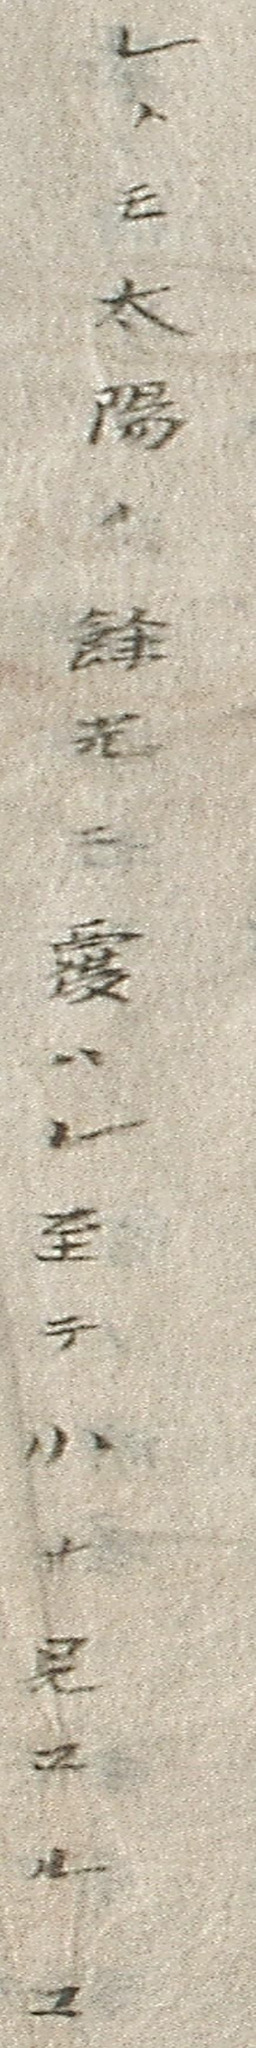レトモ太陽ノ餘光ニ覆ハレ至テ小サ見ユルユ
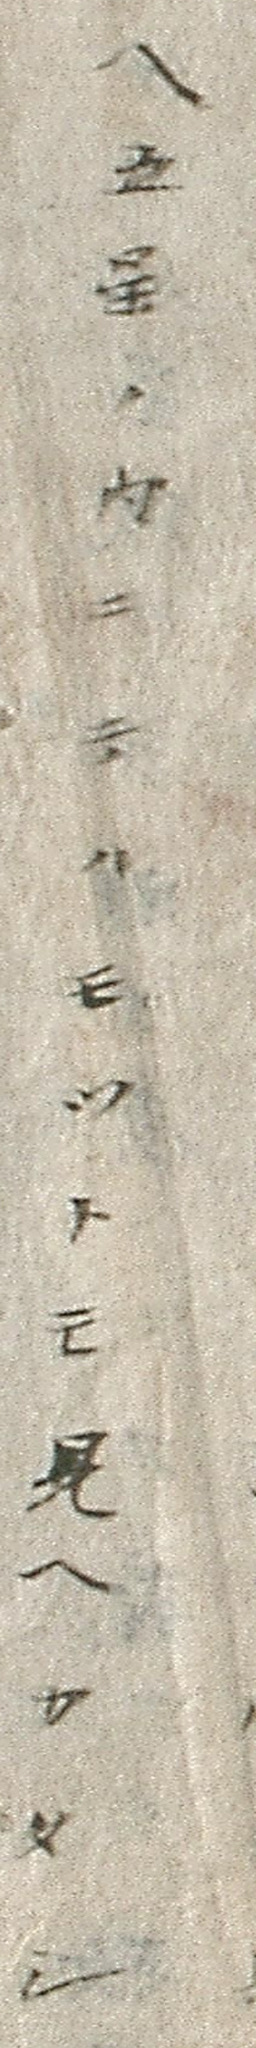ヘ五星ノ内ニテハモツトモ見ヘカタシ
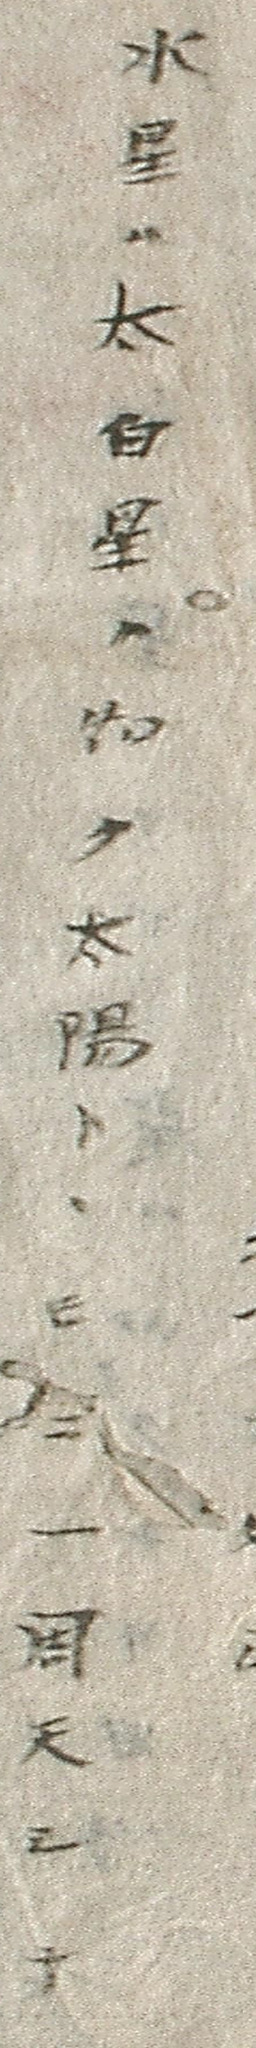水星ハ太白星ノ如ク太陽トヽモニ一周天シナ
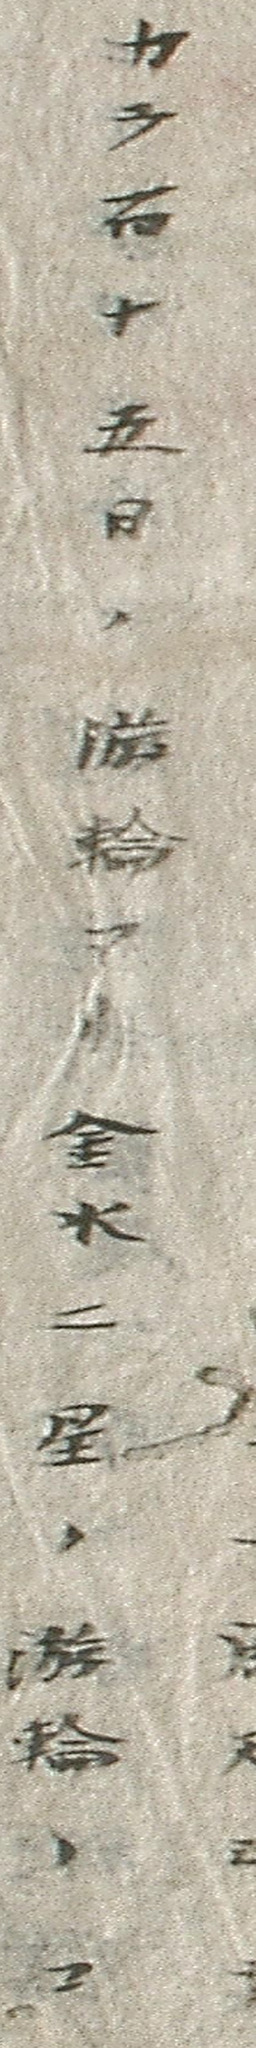カラ百十五日ノ游輪アリ金水ニ星ノ游輪ノコ
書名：天學便蒙図説
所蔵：東京大学地震研究所図書室 Earthquake Research Institute Library, The University of Tokyo, JAPAN
